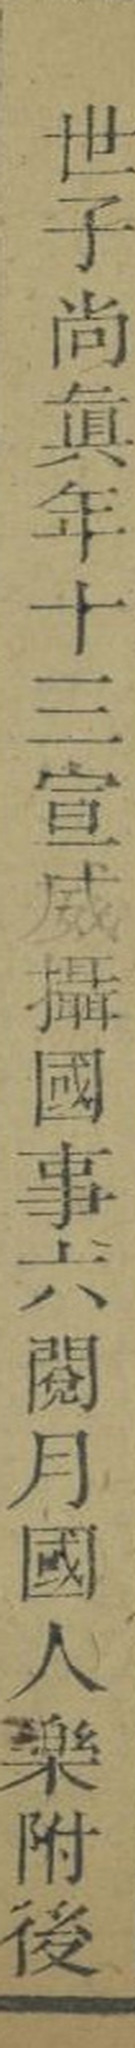世子尚真年十三宣威摂国事六閲月国人楽附後
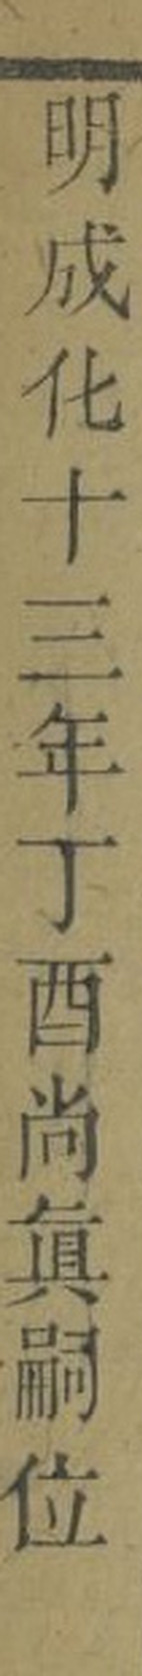明成化十三年丁酉尚宣真位

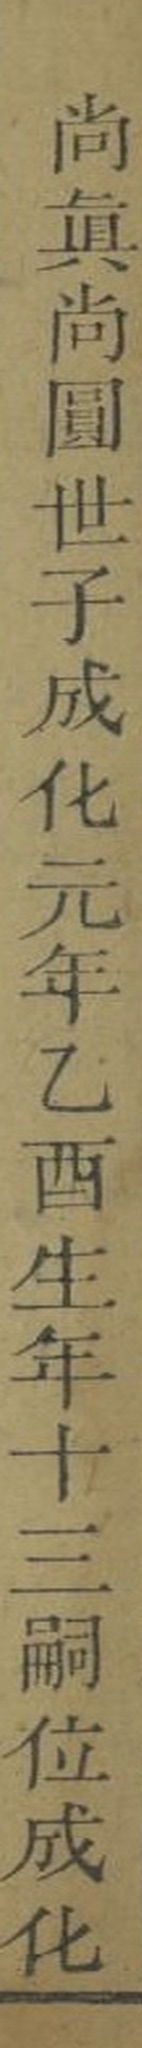尚真尚円世子成化元年乙酉生年十三嗣位成化
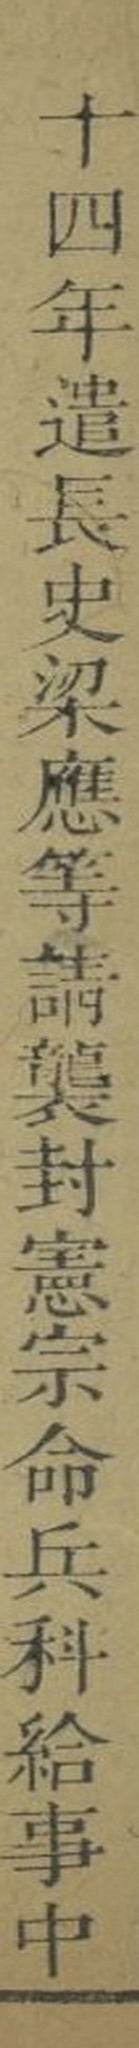十四年遣長史梁応等請襲封憲宗命兵科給事中
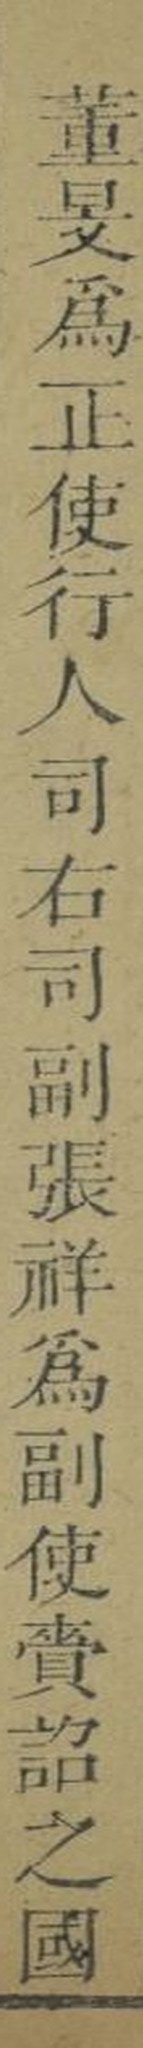董旻為正使行人司右司副張祥為副使賚詔之国
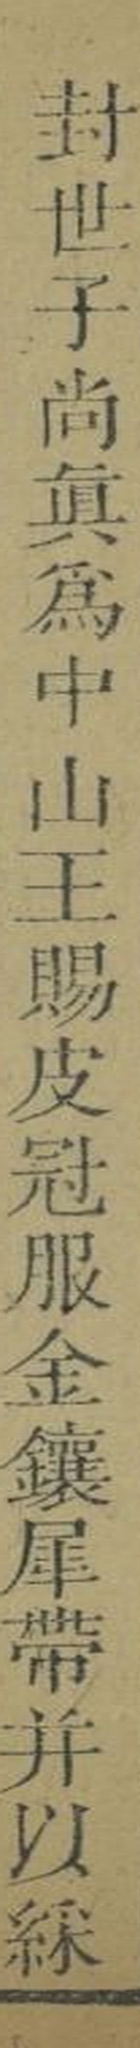封世子尚真為中山王賜皮冠服金鑲犀帯并以綵
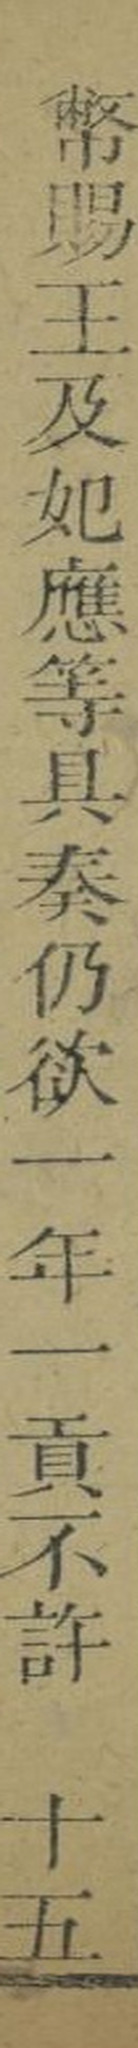幣賜王及妃応等具奏仍欲一年一貢不許十五
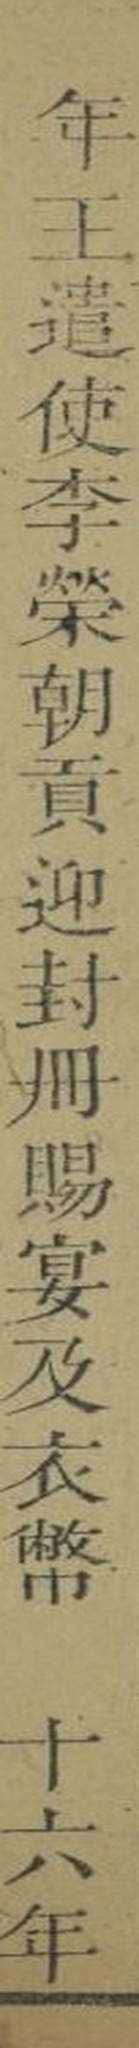年王遣使李栄朝貢迎封冊賜宴及衣幣十六年
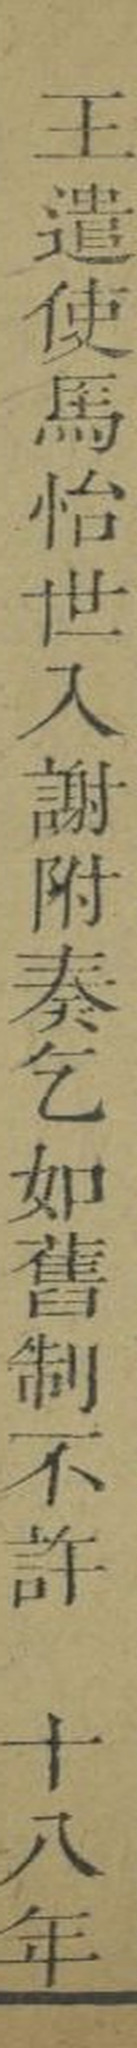王遣使馬怡世入謝附奏乞如旧制不許十八年
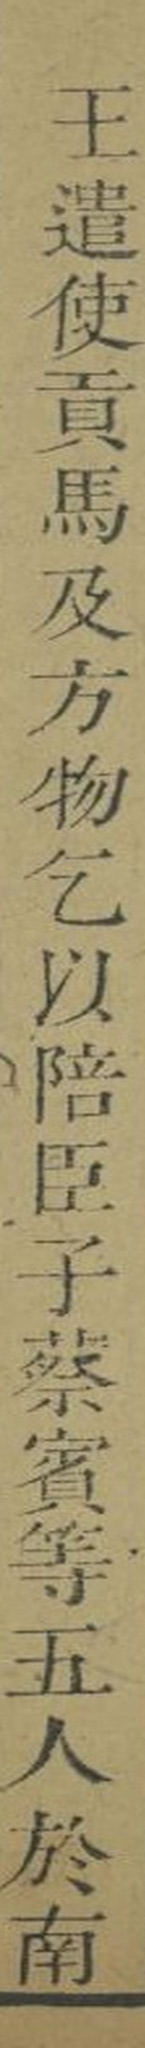王遣使貢馬及方物乞以陪臣子蔡賓等五入於南
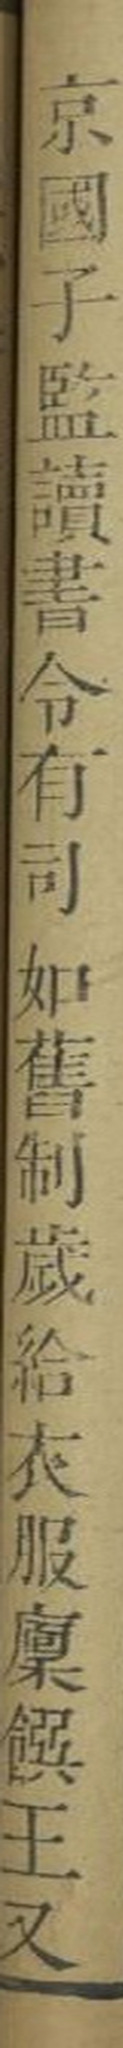京国子監読書令有司如旧制歳給衣服廩饌王又
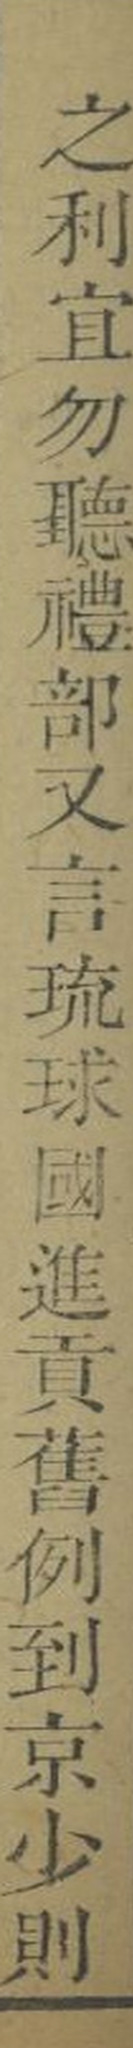之利宜勿聴礼部又言琉球国進貢旧例到京少則
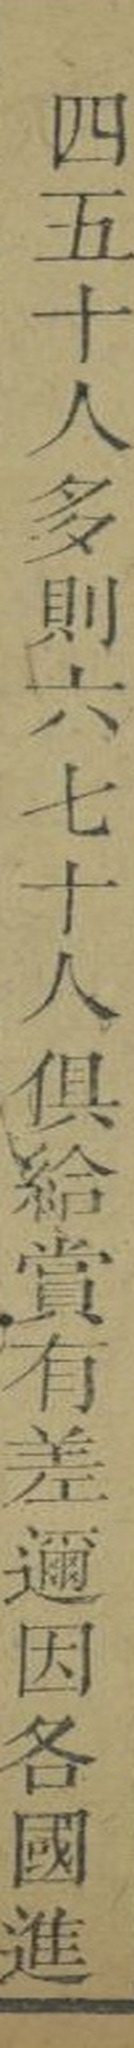四五十人多則六七十人俱給賞有差邇因各国進
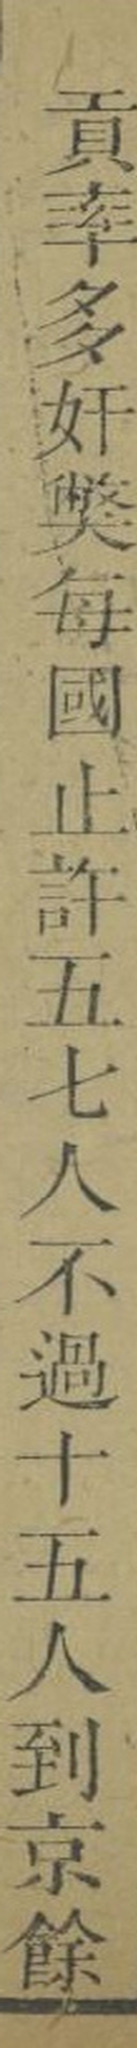貢率多奸獘毎国止許五七人不過十五人到京余
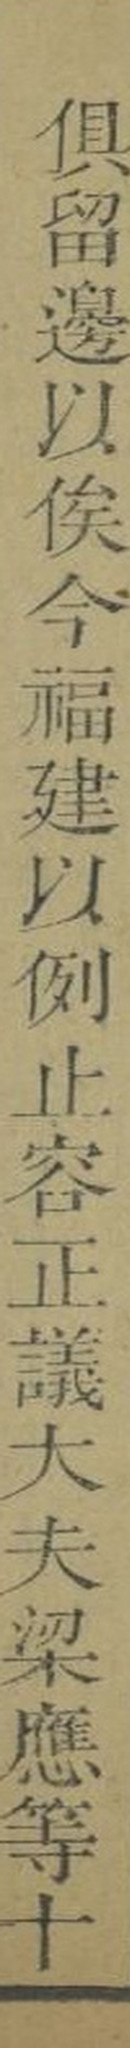俱留辺以俟今福建以例止容正議大夫梁応等十
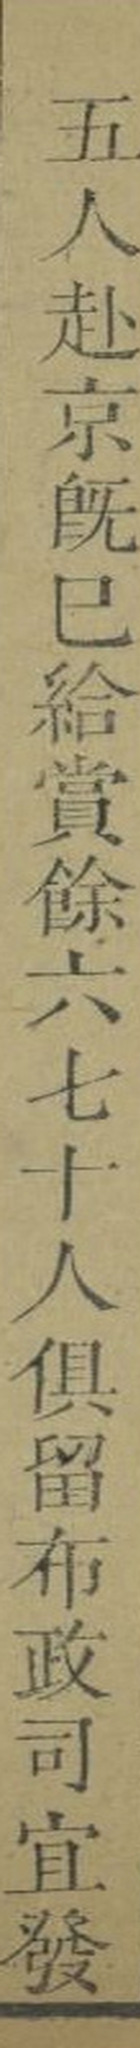五人赴京既巳給賞余六七十人俱留布政司宜発
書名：中山伝信録 巻三
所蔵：University of the Ryukyus Library
